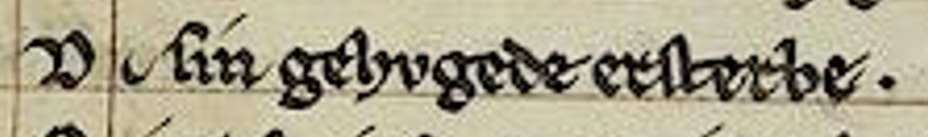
D(az) ſin gehvgede erſterbe.
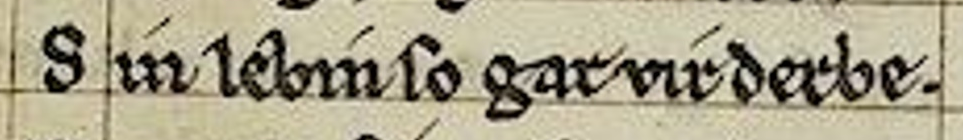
Sin lebin ſo gar virderbe.
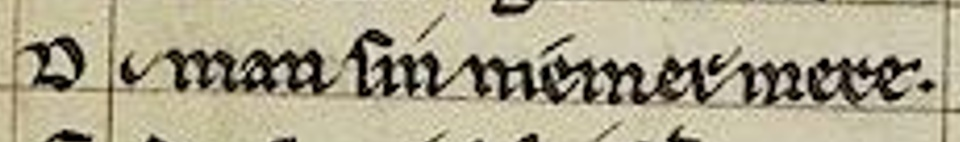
D(az) man ſin niemer mere.
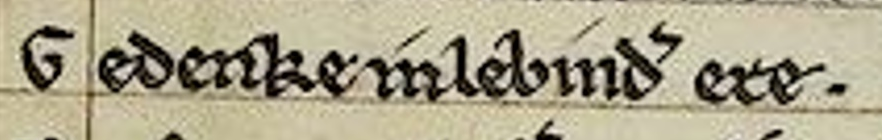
Gedenke in lebind(er) ere.
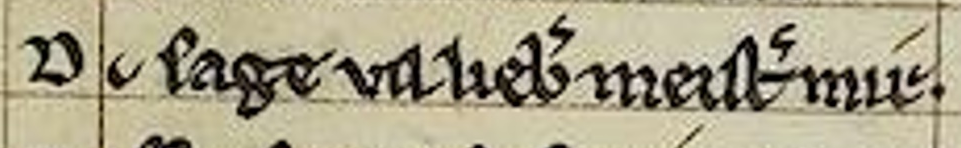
D(az) ſage vil lieb(er) meiſt(er) mir.
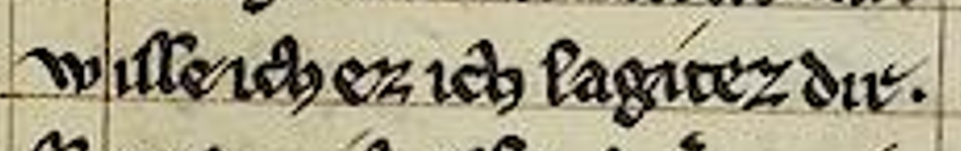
Wiſſe ich ez ſagitez dir.
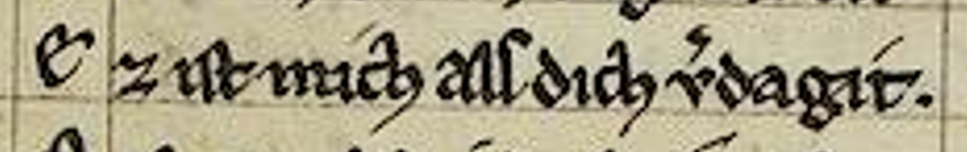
Ez iſt mich alſ dich v(er)dagit.
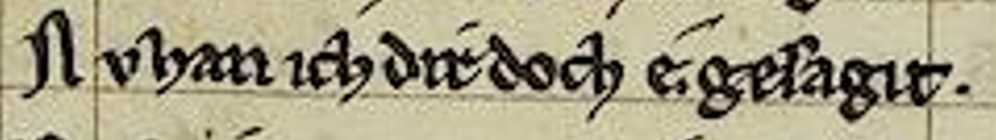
Nv han ich dir doch e geſagit.
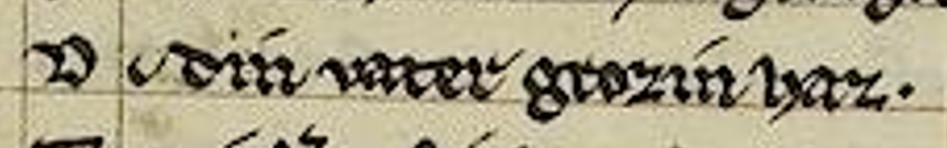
D(az) din vater grozin haz.
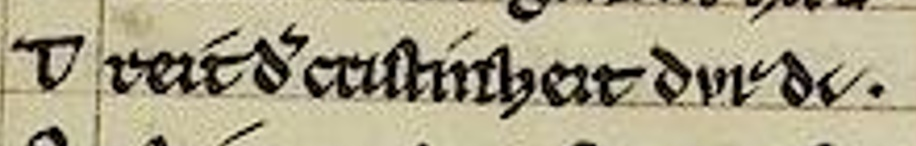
Treit d(er) criſtinheit dvr d(az).
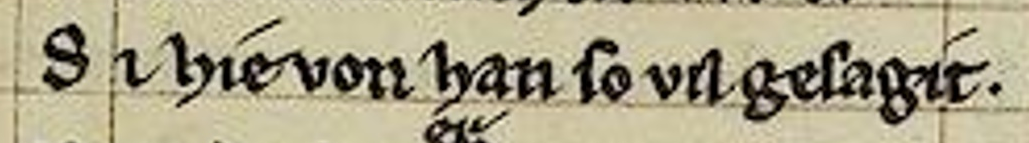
Si hie von han ſo vil geſagit.
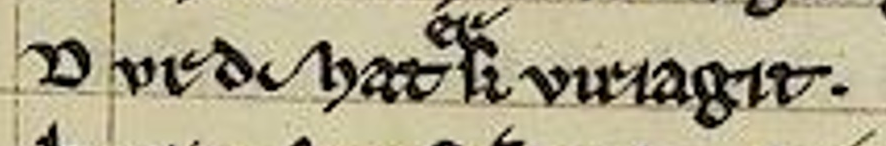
Dvr d(az) hat °(er) ſi viriagit.
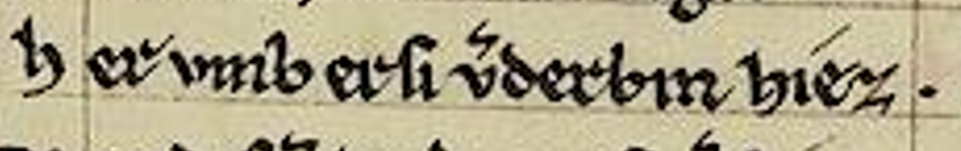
Her vmb er ſi v(er)derbin hiez.
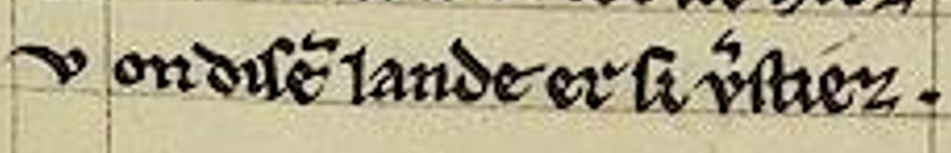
Von diſe(m) lande er ſi v(er)ſtiez.
